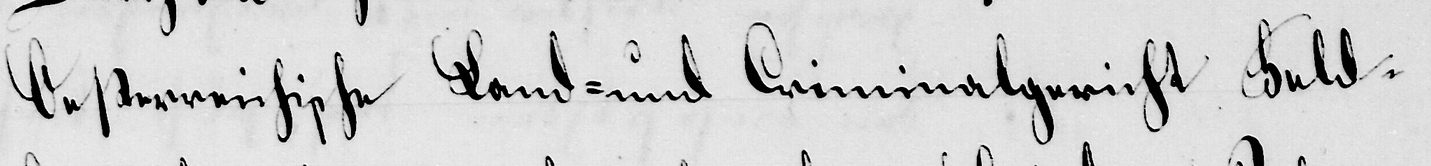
Oesterreichische Land- und Criminalgericht Feld¬
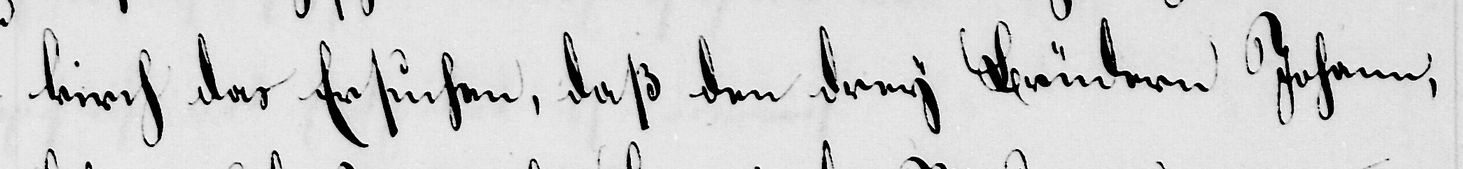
kirch das Ersuchen, daß den drey Brüdern Johann,
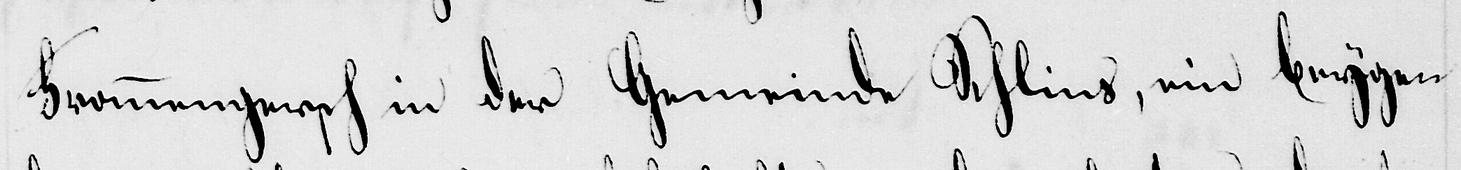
Frommengersch in der Gemeinde Schlins, ein beyge¬
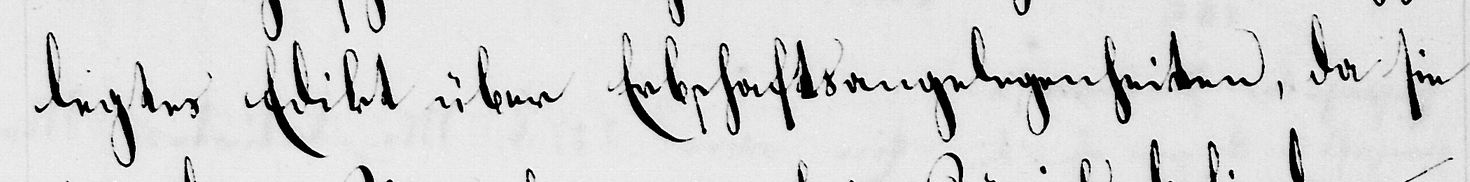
legtes Edikt über Erbschaftsangelegenheiten, da sie
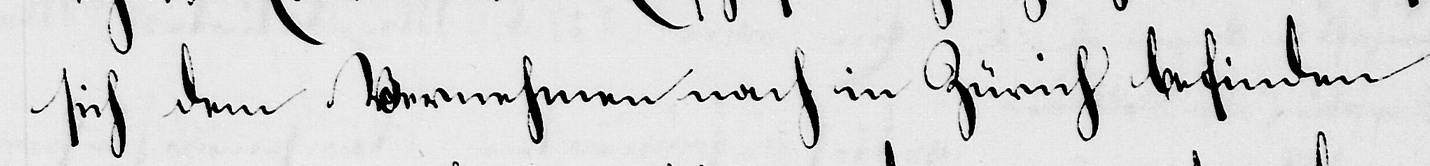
sich dem Vernehmen nach in Zürich befinden
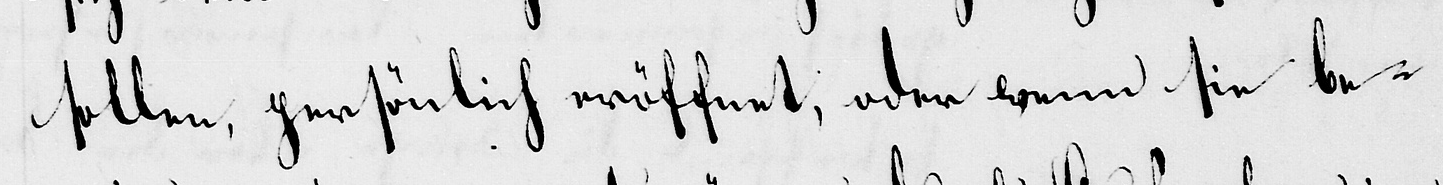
sollen, persönlich eröffnet, oder wenn sie be¬
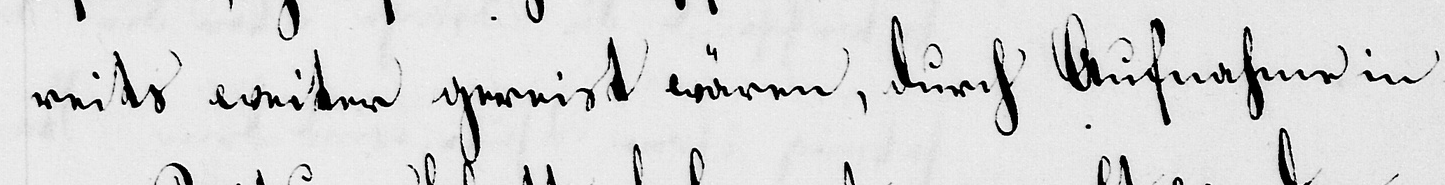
reits weiter gereist wären, durch Aufnahme in
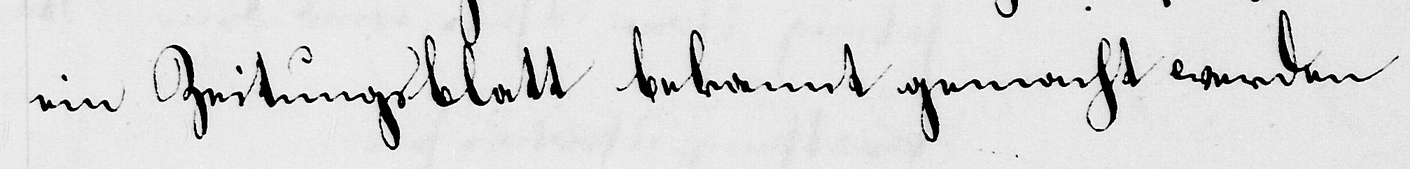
ein Zeitungsblatt bekannt gemacht werden
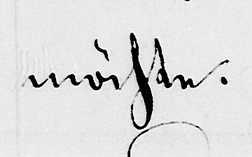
möchte.
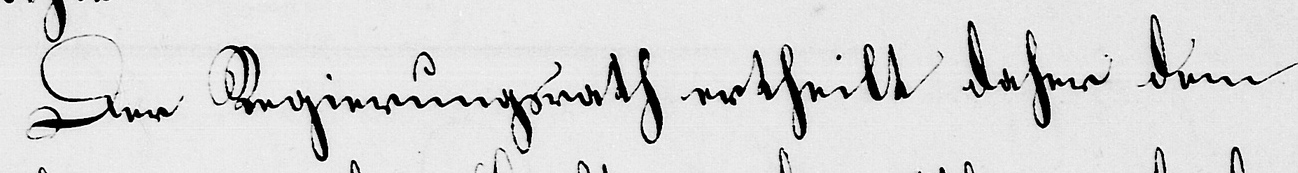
Der Regierungsrath ertheilt daher dem
